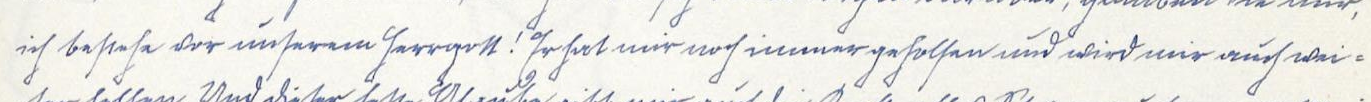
ich bestehe vor unserem Herrgott! Er hat mir noch immer geholfen und wird mir auch wei-
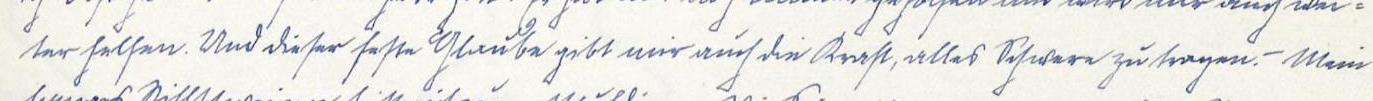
ter helfen. Und dieser feste Glauben gibt mir auch die Kraft, alles Schwere zu tragen. Mein
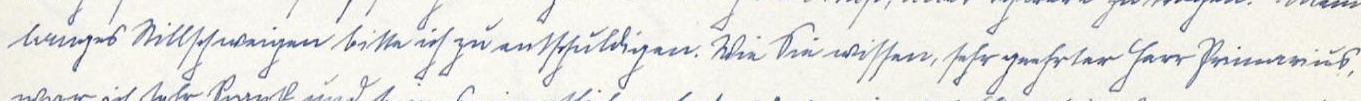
langes Stillschweigen bitte ich zu entschuldigen. Wie Sie wissen, sehr geehrter Herr Primarius,
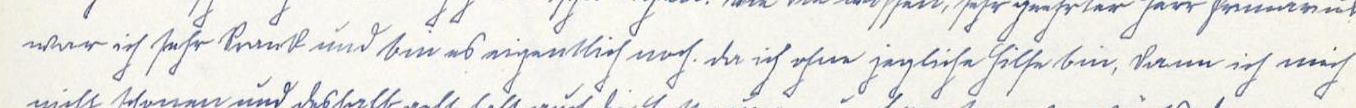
war ich sehr krank und bin es eigentlich noch. Da ich ohne jegliche Hilfe bin, kann ich mich
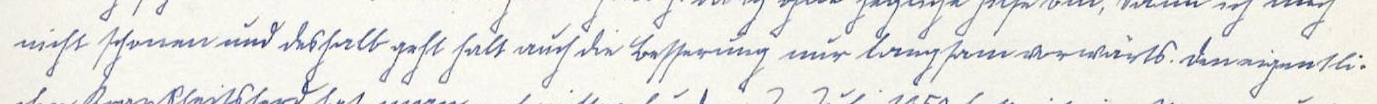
nicht schonen und deshalb geht halt auch die Besserung nur langsam vorwärts. Den eigentli-
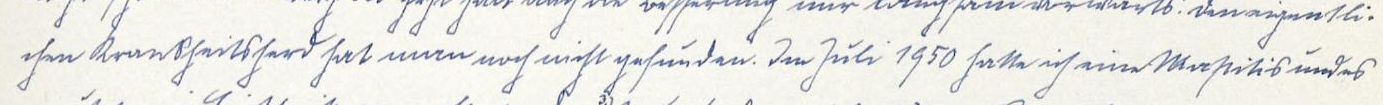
chen Krankheitsherd hat man noch nicht gefunden. Im Juli 1950 hatte ich eine Mastitis und es
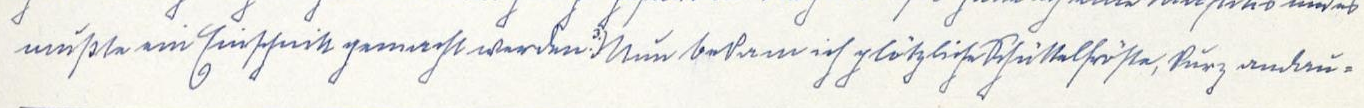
musste ein Einschnitt gemacht werden. Nun bekam ich plötzlich Schüttelfröste, kurz andau-
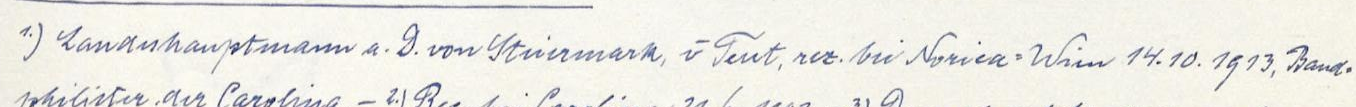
1) Landeshauptmann a. D. von Steiermark, v/o Tent, rez. bei Norica -Wien 14. 10. 1913, Band-
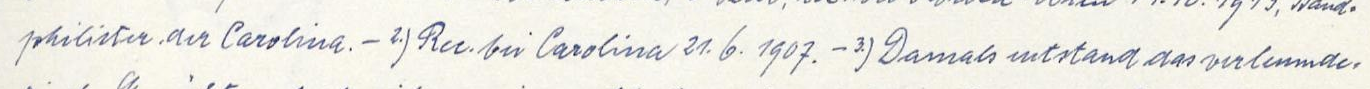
philister der Carolina.- 2) Rez. bei Carolina 21. 6. 1907.- 3) Damals entstand das verleumde-
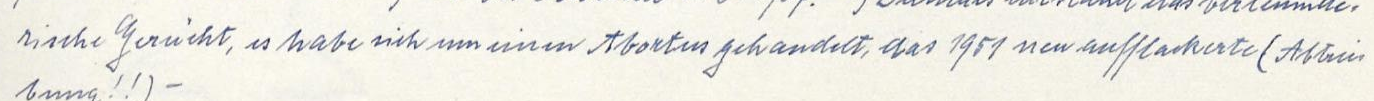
rische Gerücht, es habe sich um einen Abortus gehandelt, das 1951 nen aufflackerte (Abtrei-
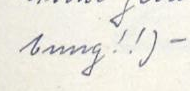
bung!!)-
